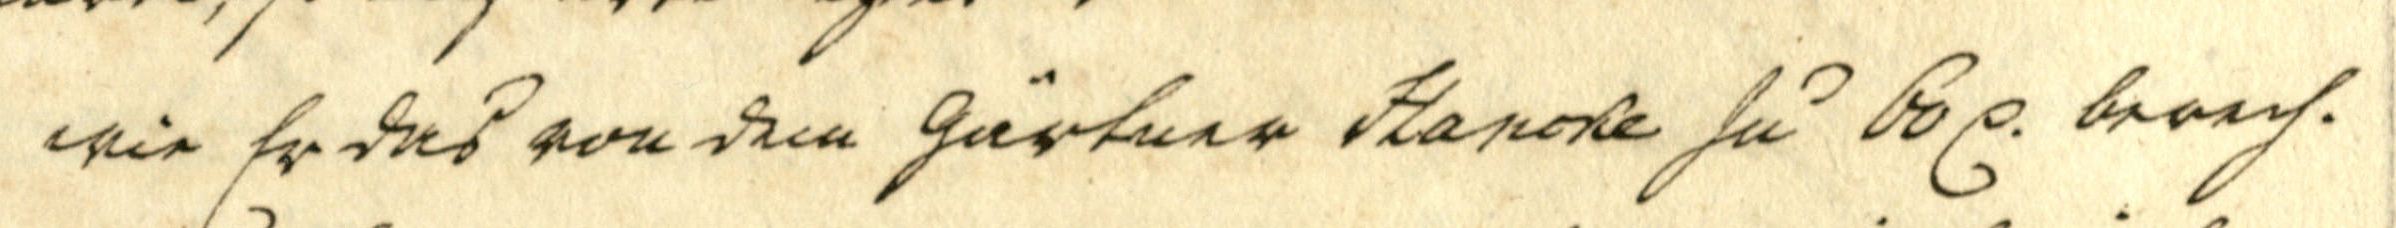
wie Er das von dem Gärtner Hancke zu 60 l. berech¬
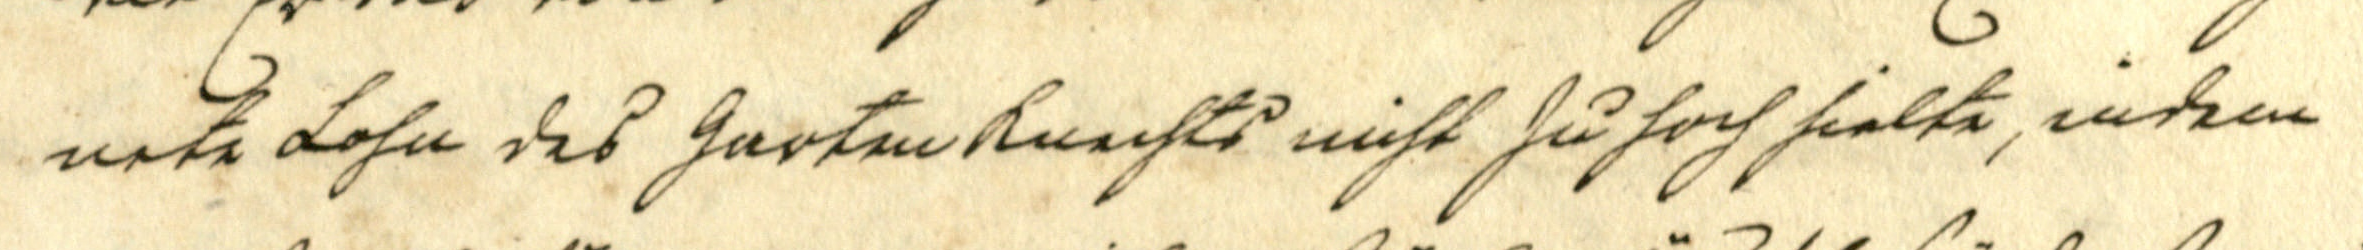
nete Lohn des Gartenknechts nicht zu hoch hielte, indem
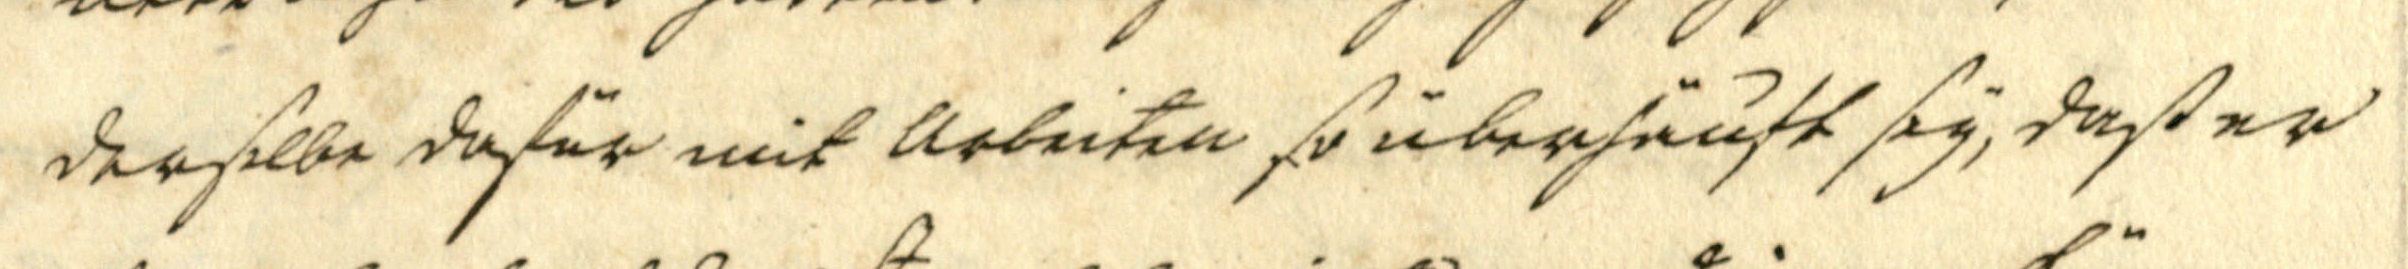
derselbe dafür mit Arbeiten so überhäuft seÿ, daß er
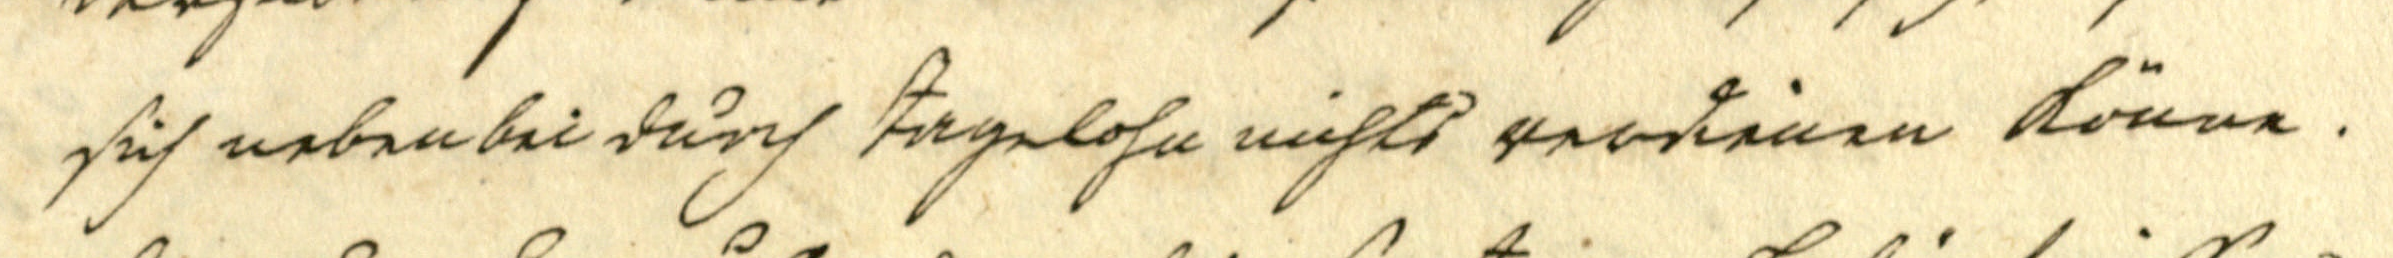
sich nebenbei durch Tagelohn nichts verdienen könne.
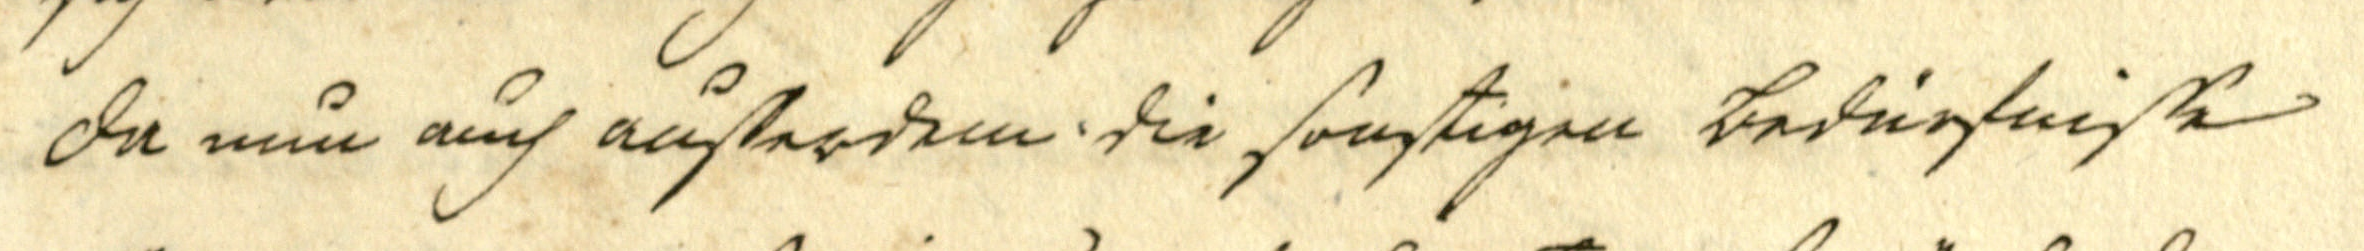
Da nun auch ausserdem die sonstigen Bedürfnisse
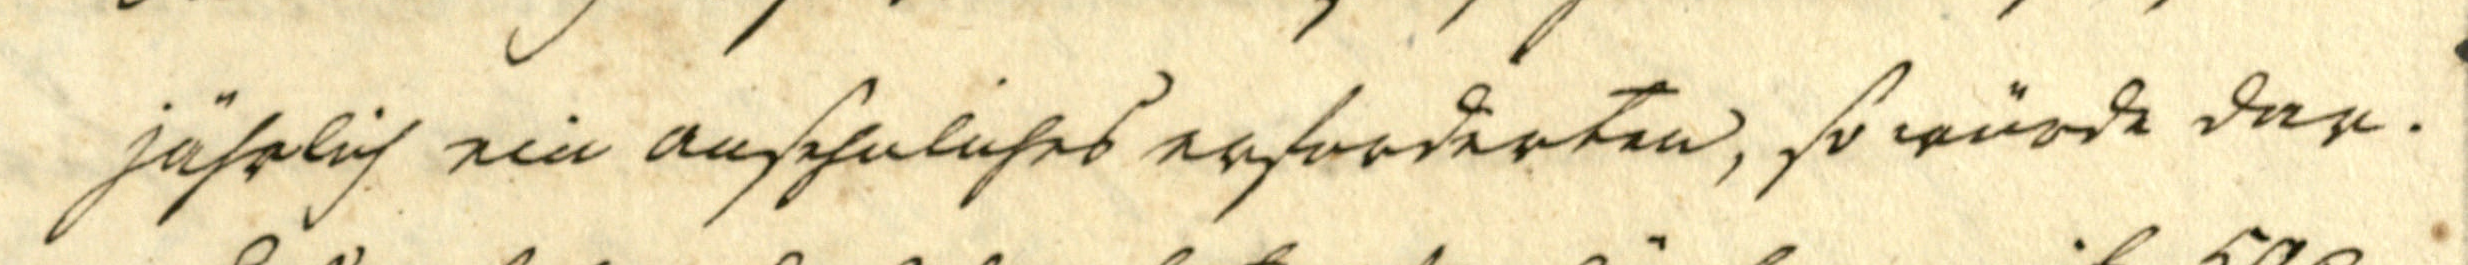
jährlich ein ansehnliches erforderten, so würde dar¬
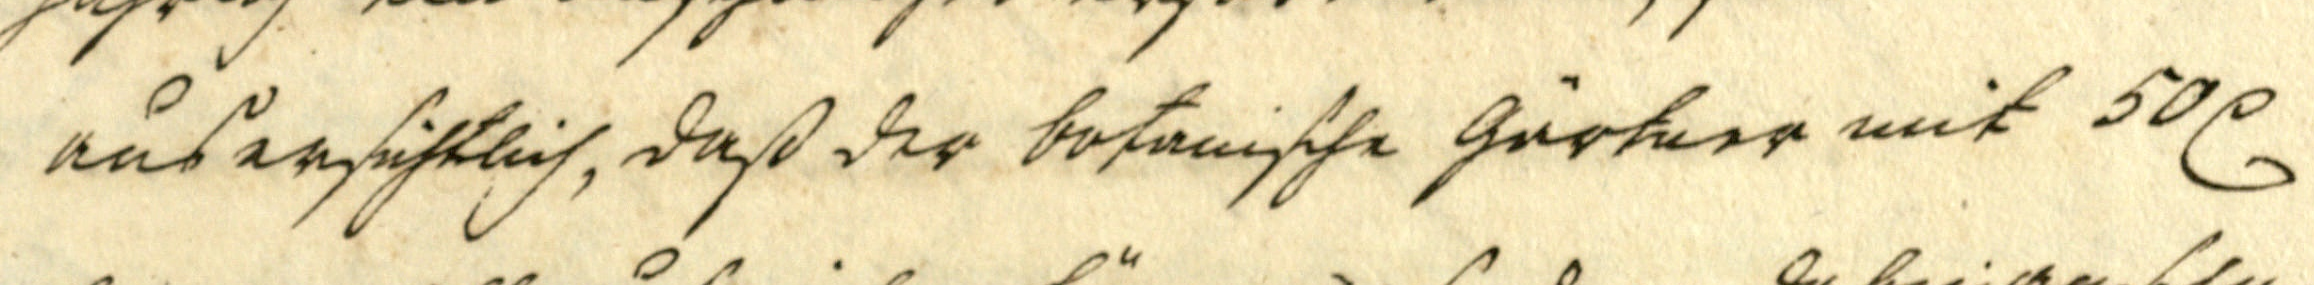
aus ersichtlich, daß der botanische Gärtner mit 50 l.
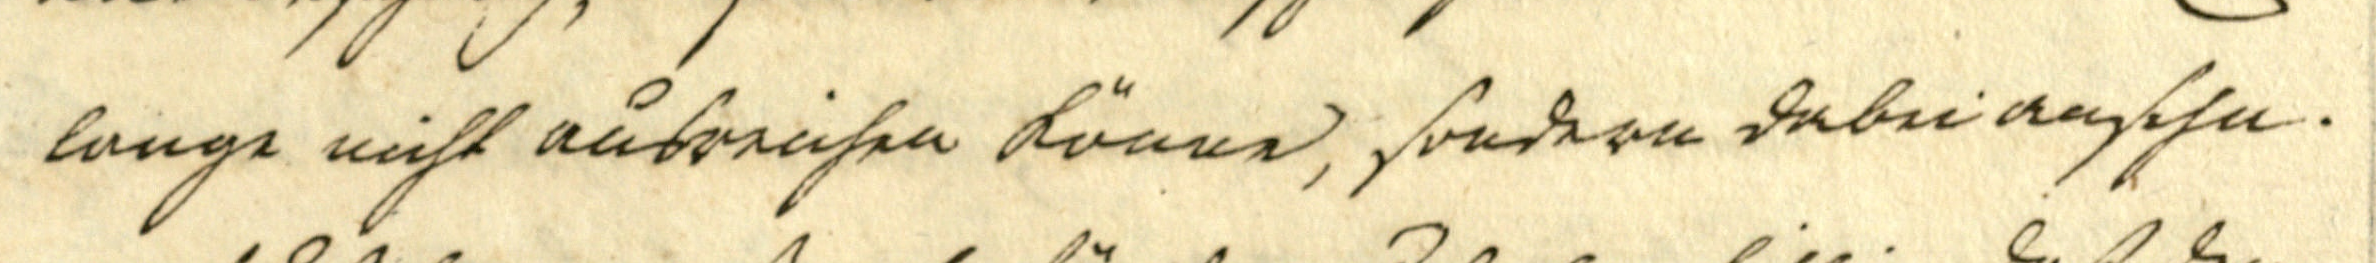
lange nicht ausreichen könne, sondern dabei ansehn¬
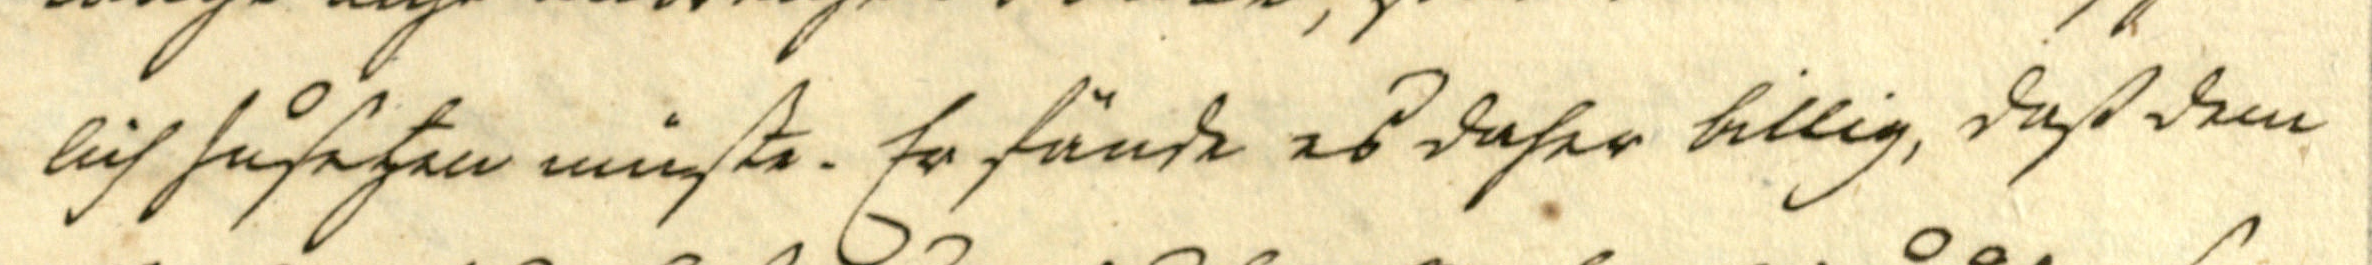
lich zusetzen müßte. Er fände es daher billig, daß dem
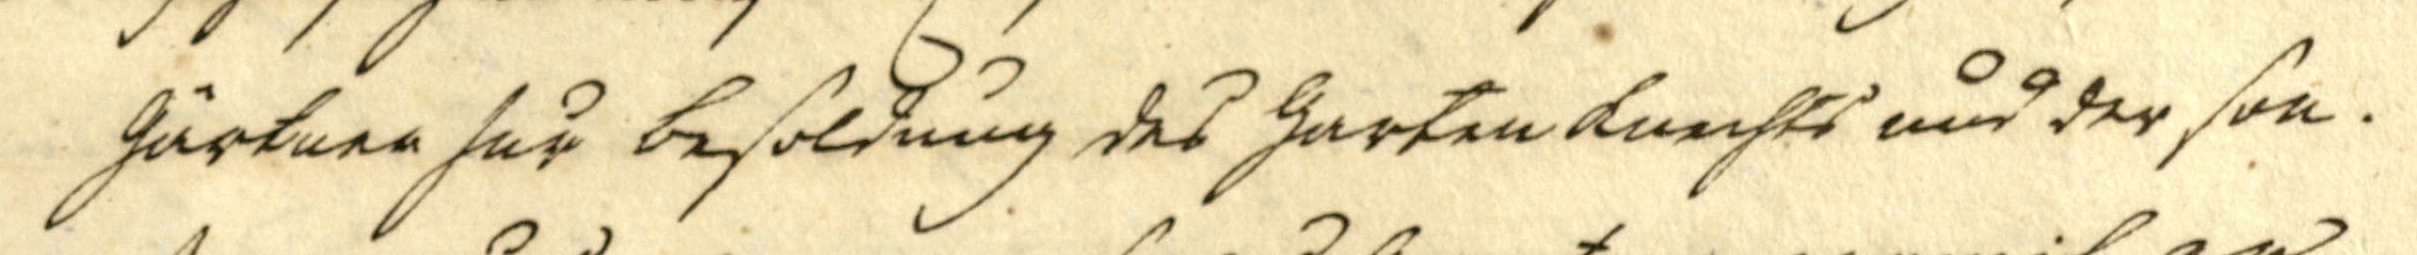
Gärtner zur Besoldung des Gartenknechts und der son¬
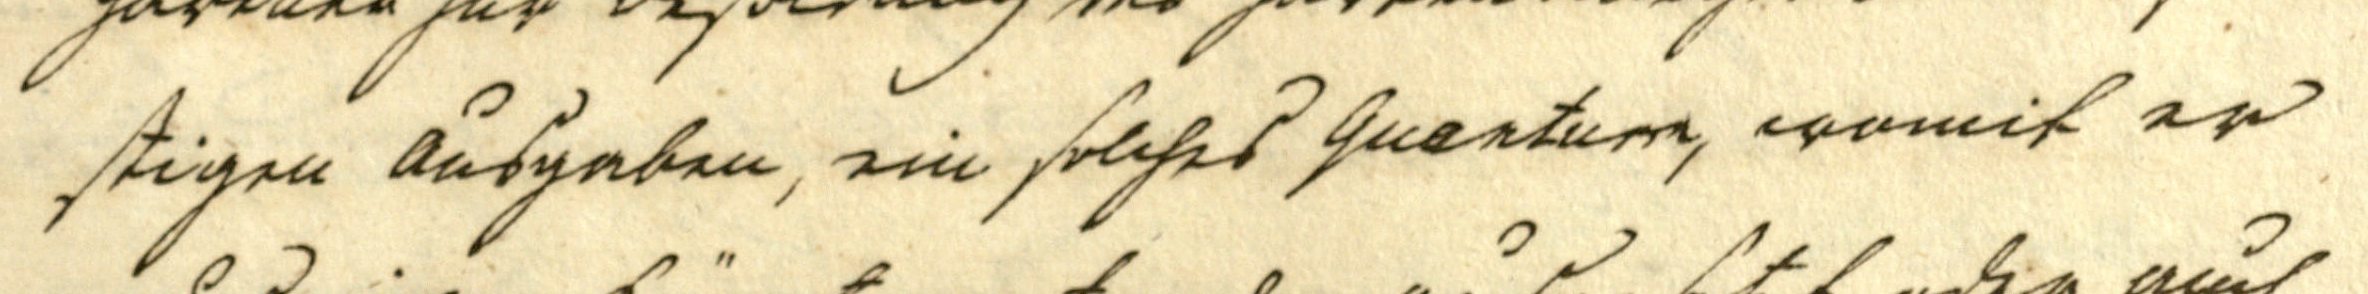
stigen Ausgaben, ein solches Quantum, womit er
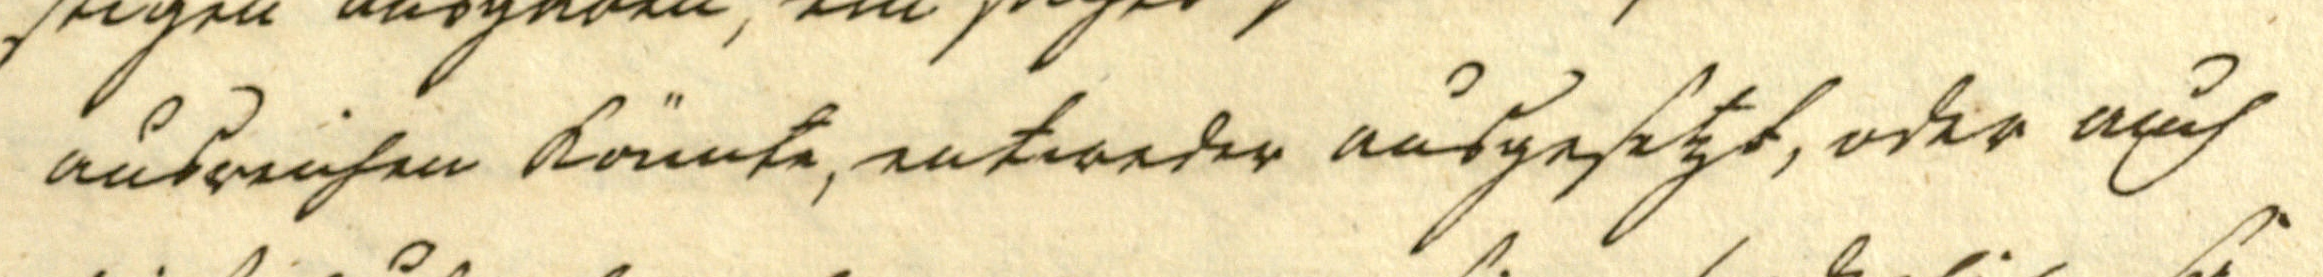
ausreichen könnte, entweder ausgesetzt, oder auch
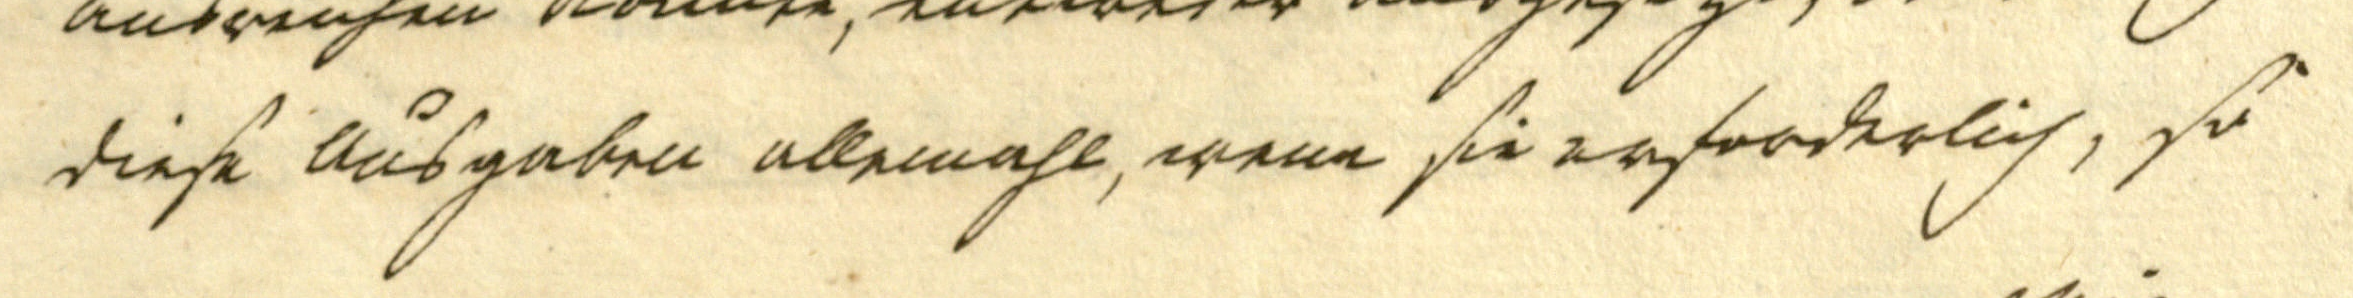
diese Ausgaben allemahl, wenn sie erforderlich, so
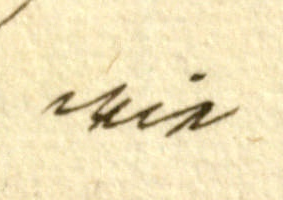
wie
